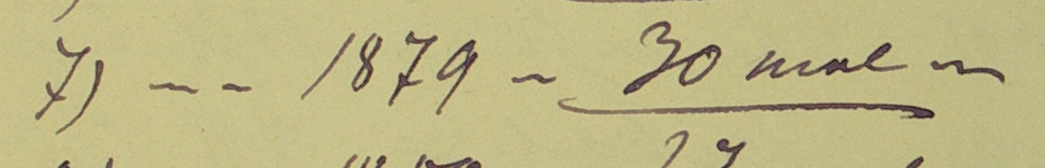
7.) 1879 = * = 30 * *
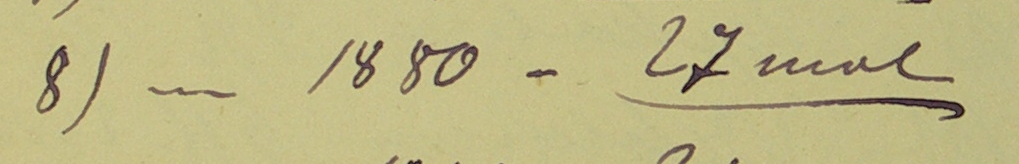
8.) 1880 = * = 27 * *
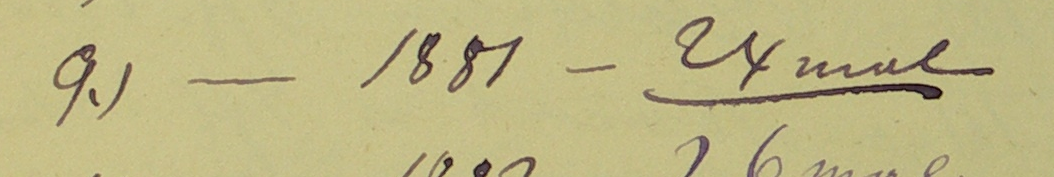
9.) 1881 = * = 24 * *
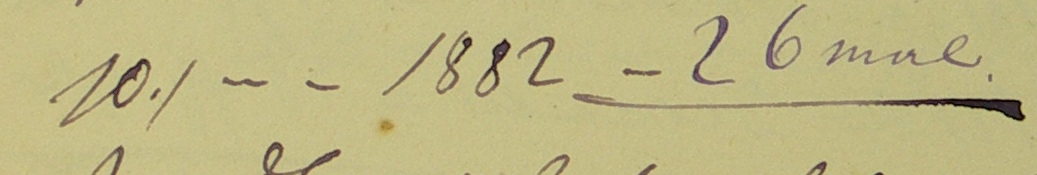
10.) 1882 = * = 26 * *
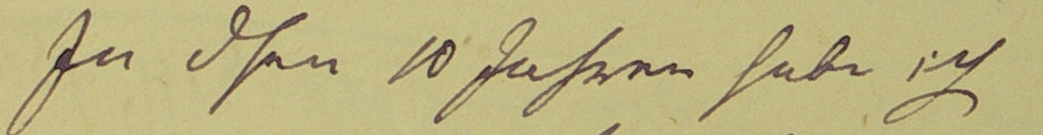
In den 10 Jahren habe ich
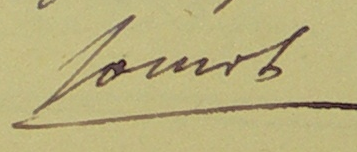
somit….
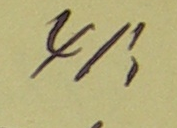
41
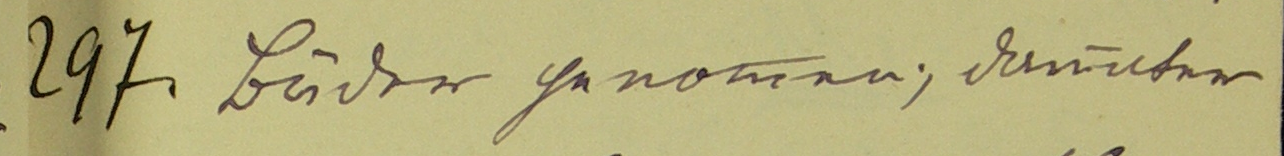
…..297 Bäder gemacht; darunter
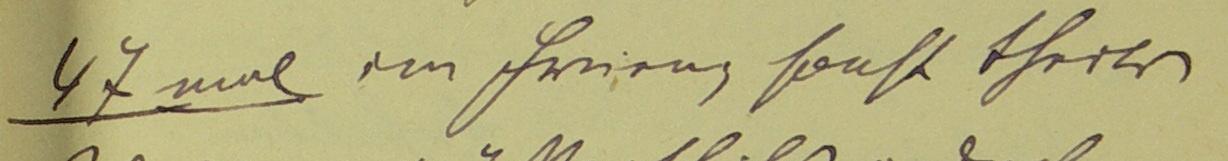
47 mal im Freien, sonst theils
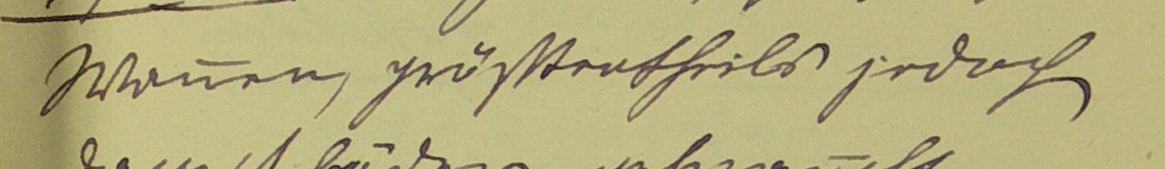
Wannen, größtentheils jedoch
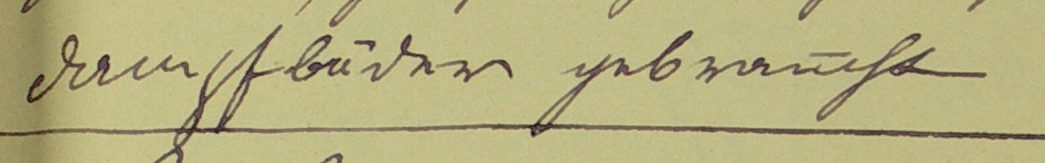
Dampfbäder gebraucht.
